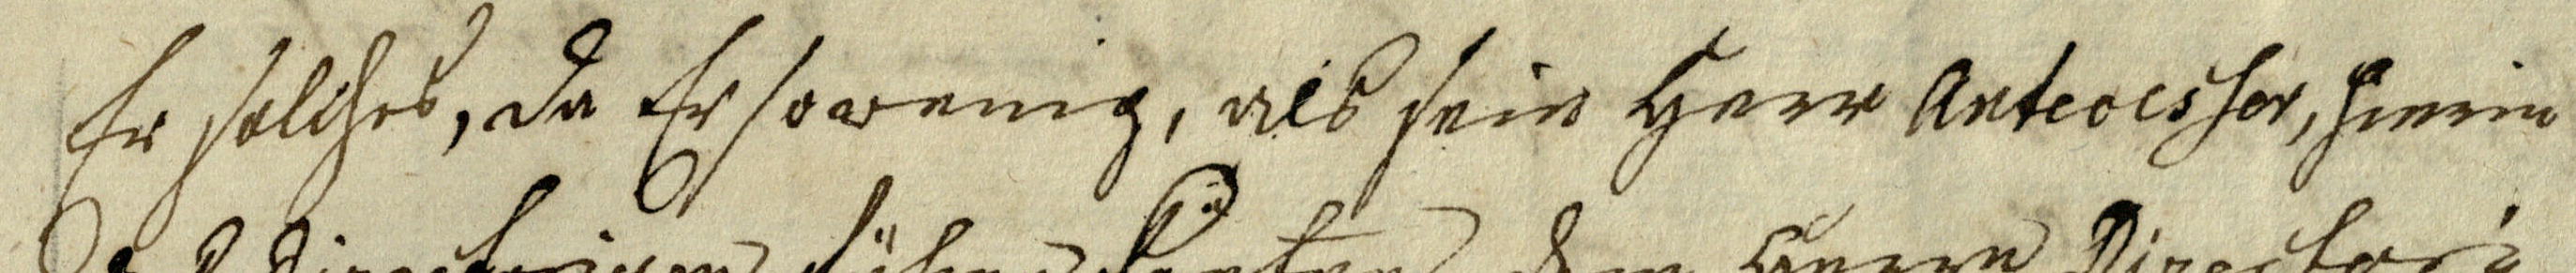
Er solches, da Er sowenig, als sein Herr Antecessor, hierin
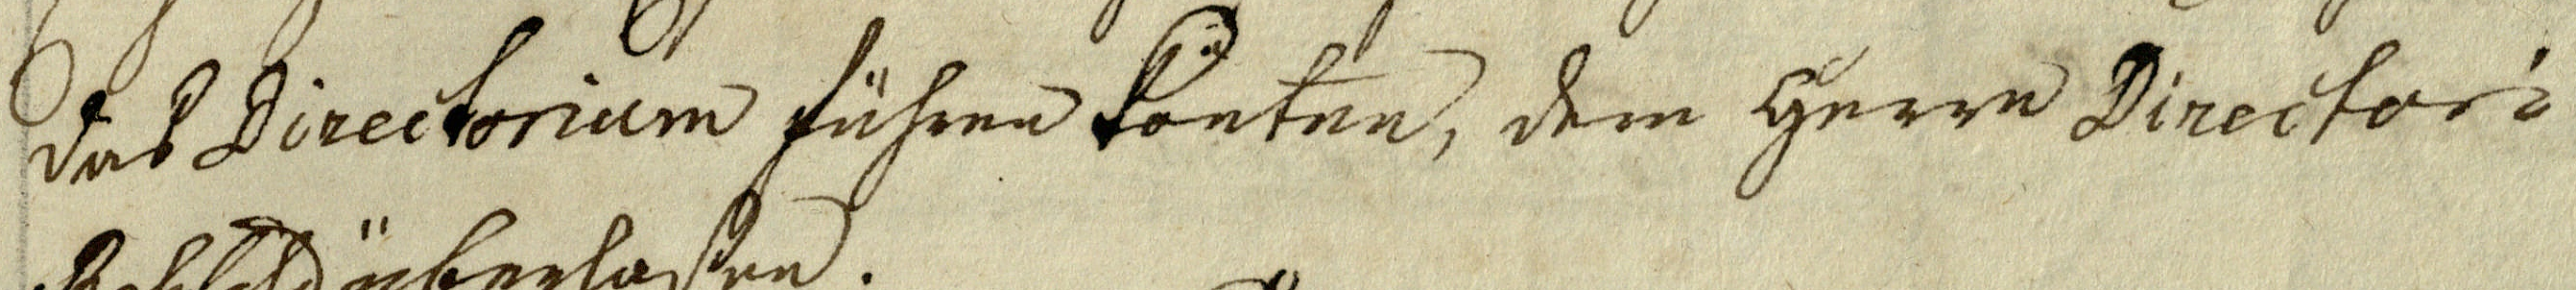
das Directorium führen könten, dem Herrn Director
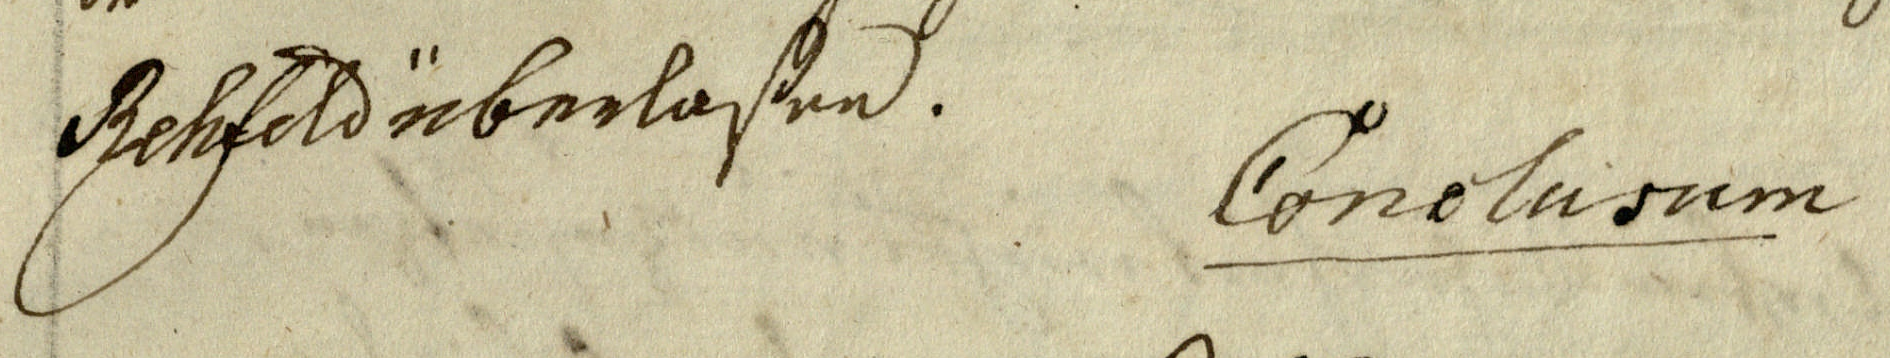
Rehfeld überlaßen. Conclusum
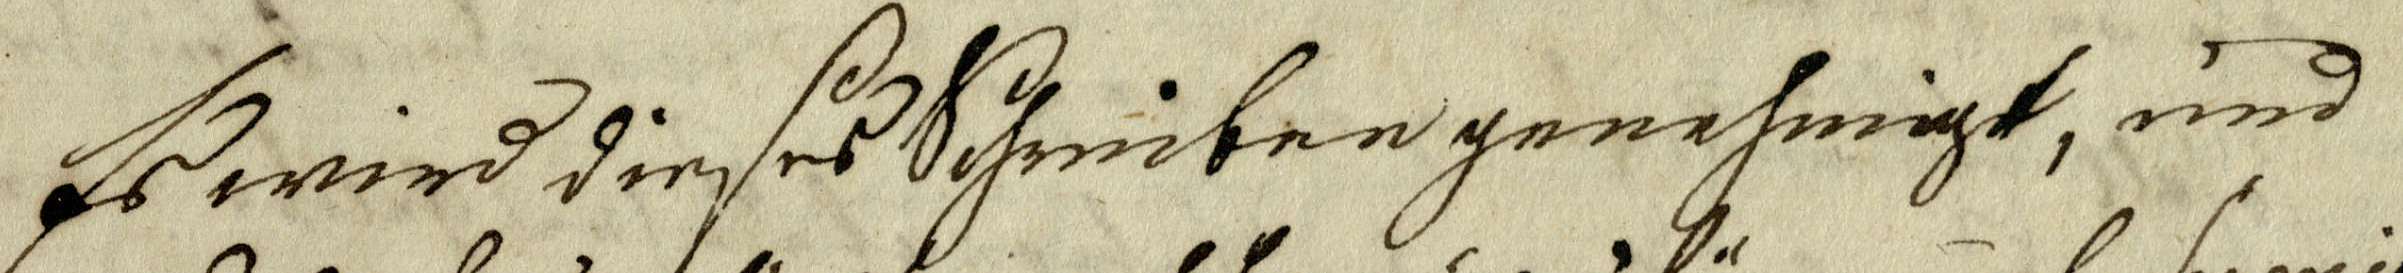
Es wird dieses Schreiben genehmigt, und
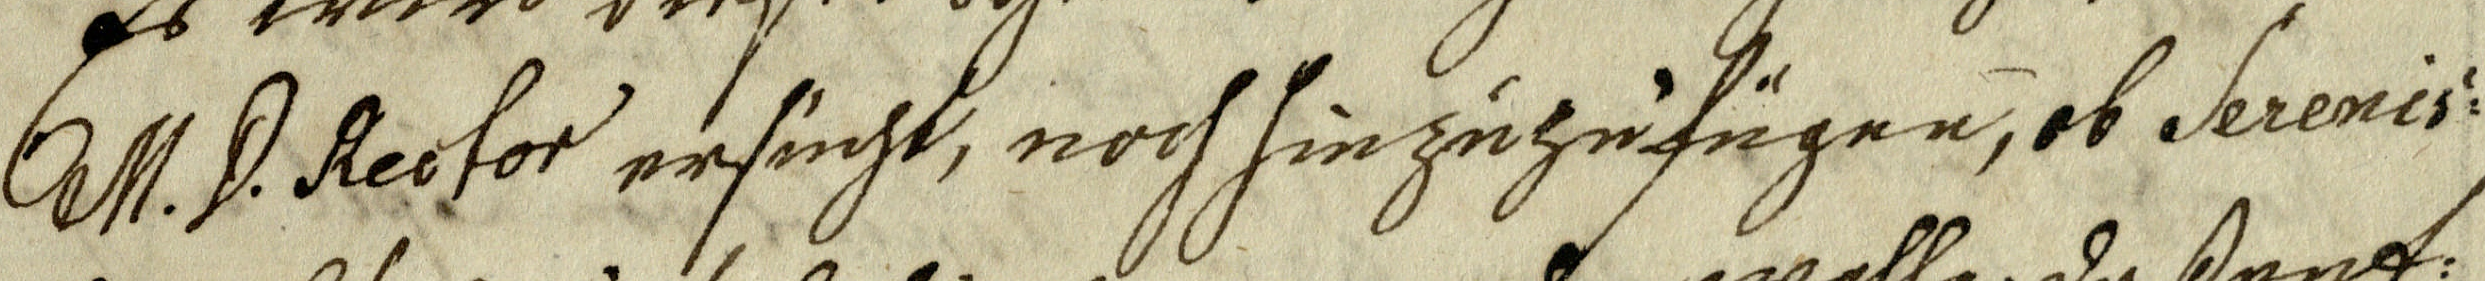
M. D. Rector ersucht, noch hinzuzufügen, ob Serenis¬
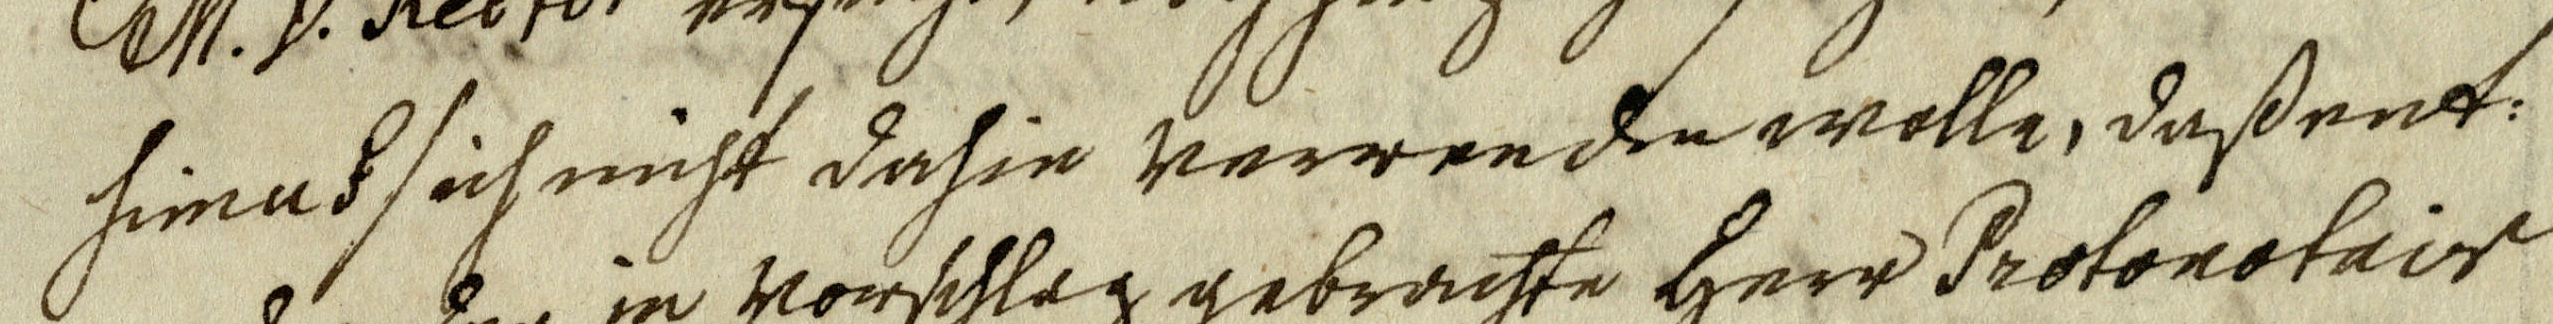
simus sich nicht dahin verwenden wolle, daß ent¬
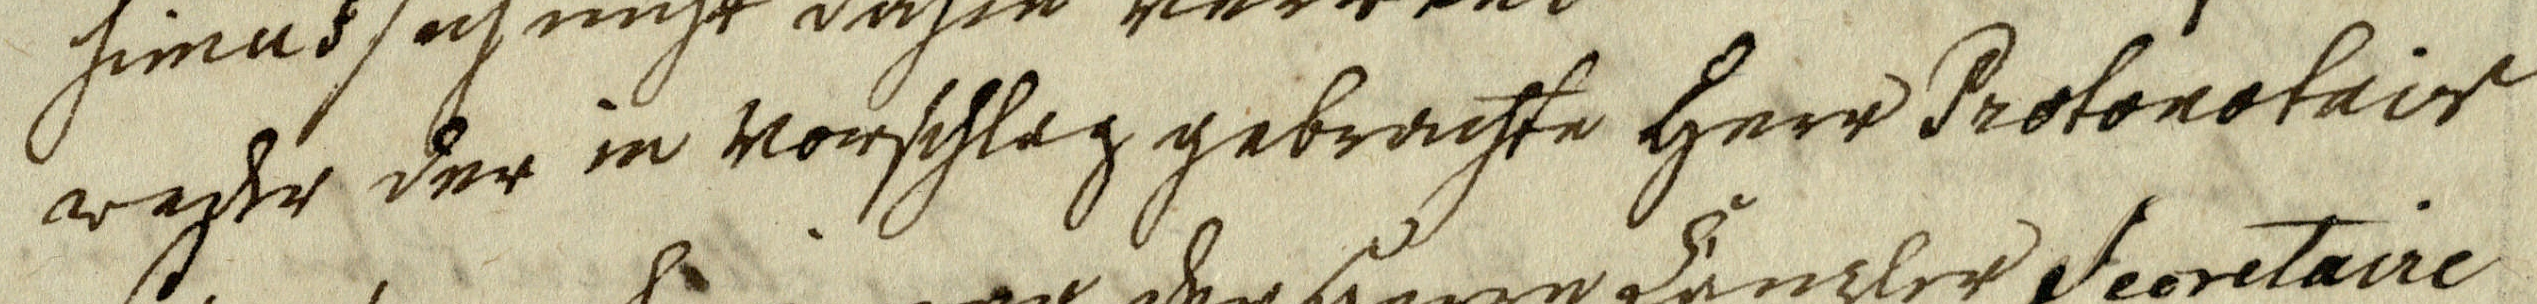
weder der in Vorschlag gebrachte Herr Protonotair
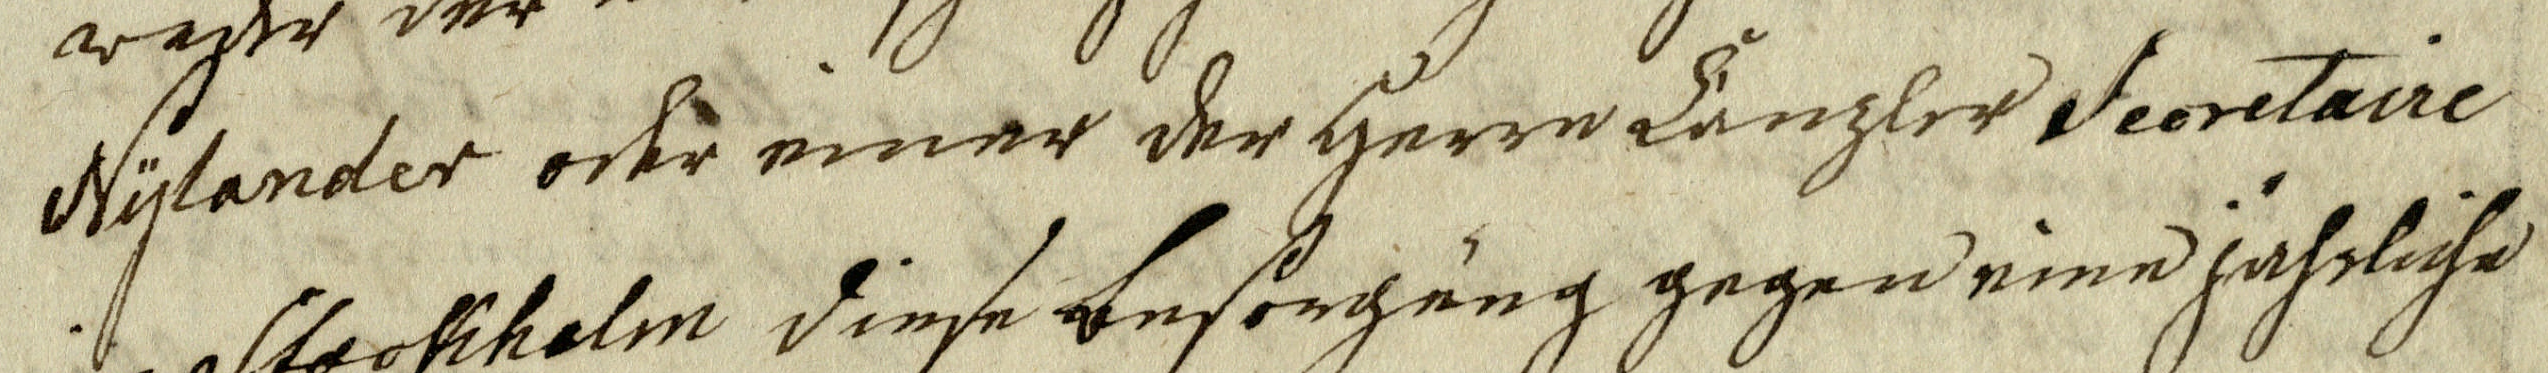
Nÿlander oder einer der Herrn Canzler Secretaire
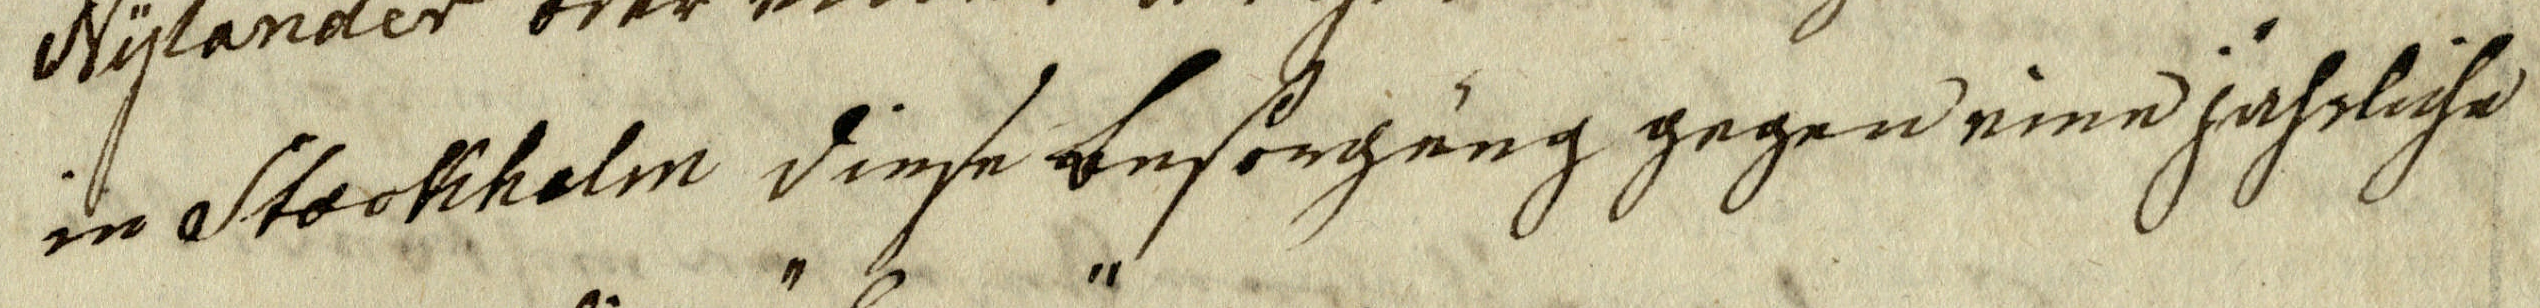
in Stockholm diese Besorgung gegen eine jährliche
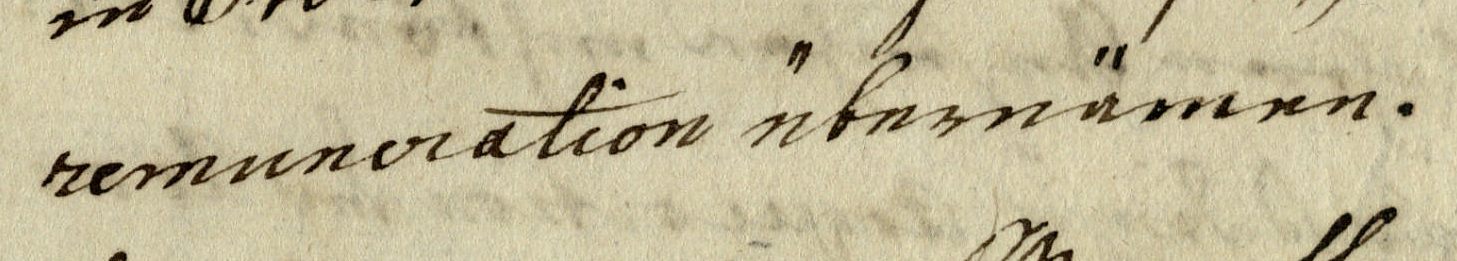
remuneration übernämen.
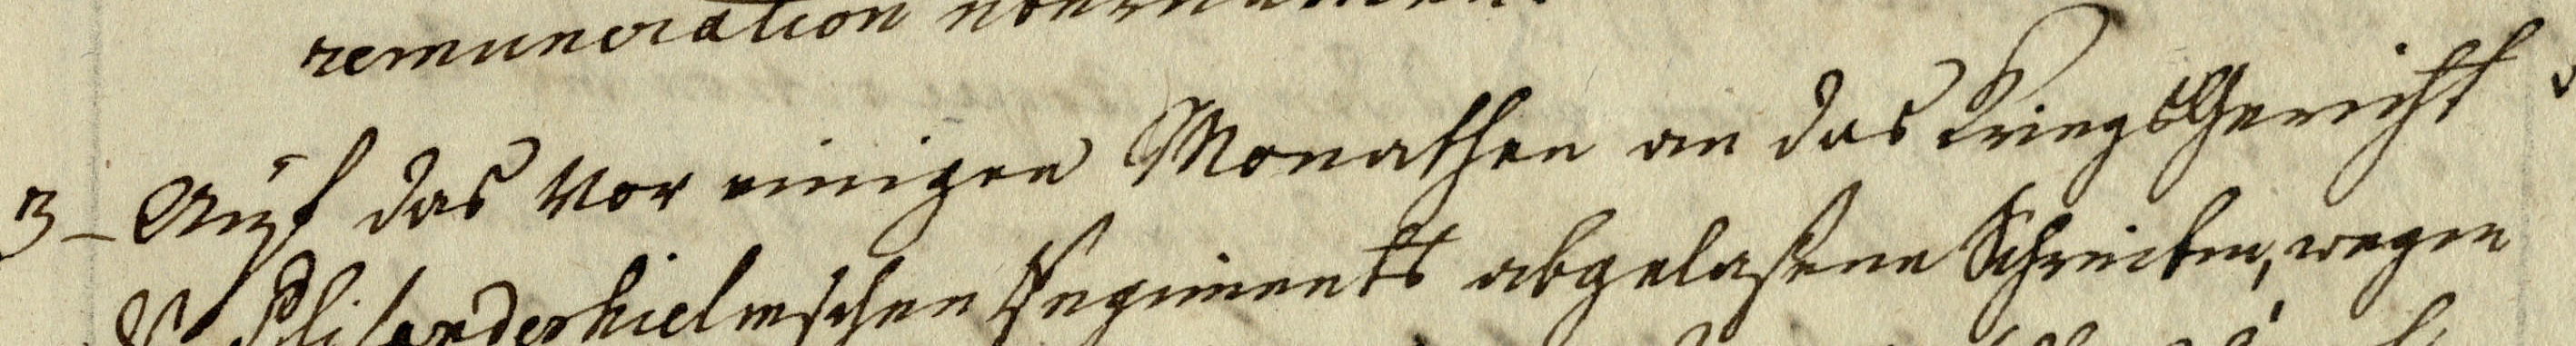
3. Auf das vor einigen Monathen an das KriegsGericht
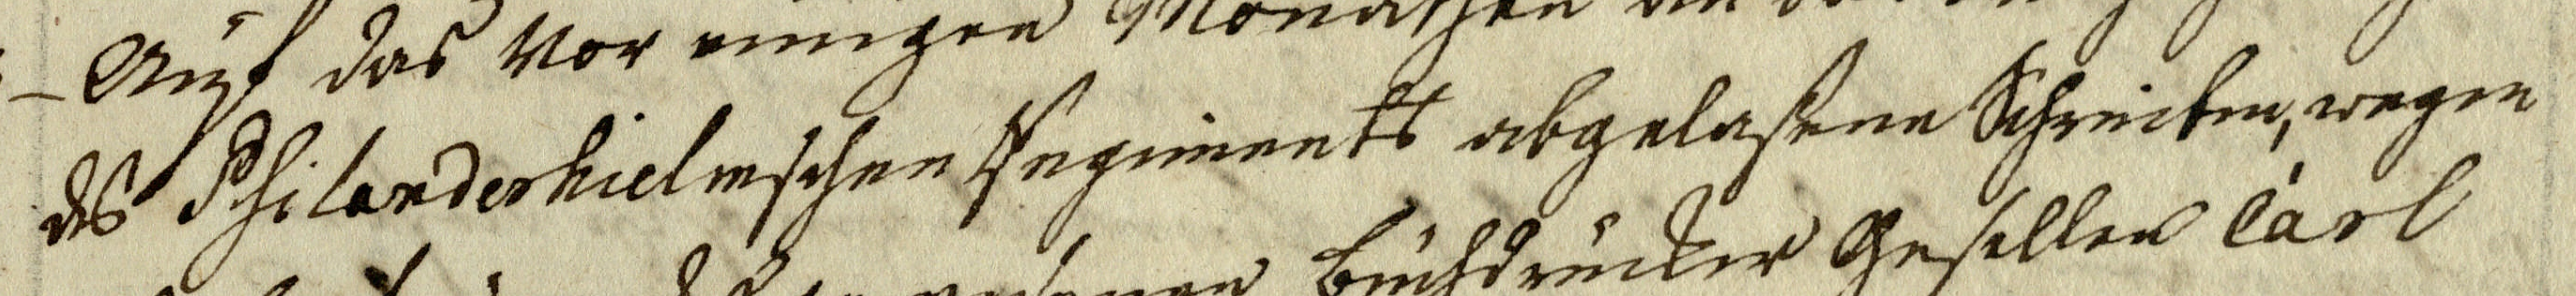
des Philanderhielmschen Regiments abgelaßenen Schreiben, wegen
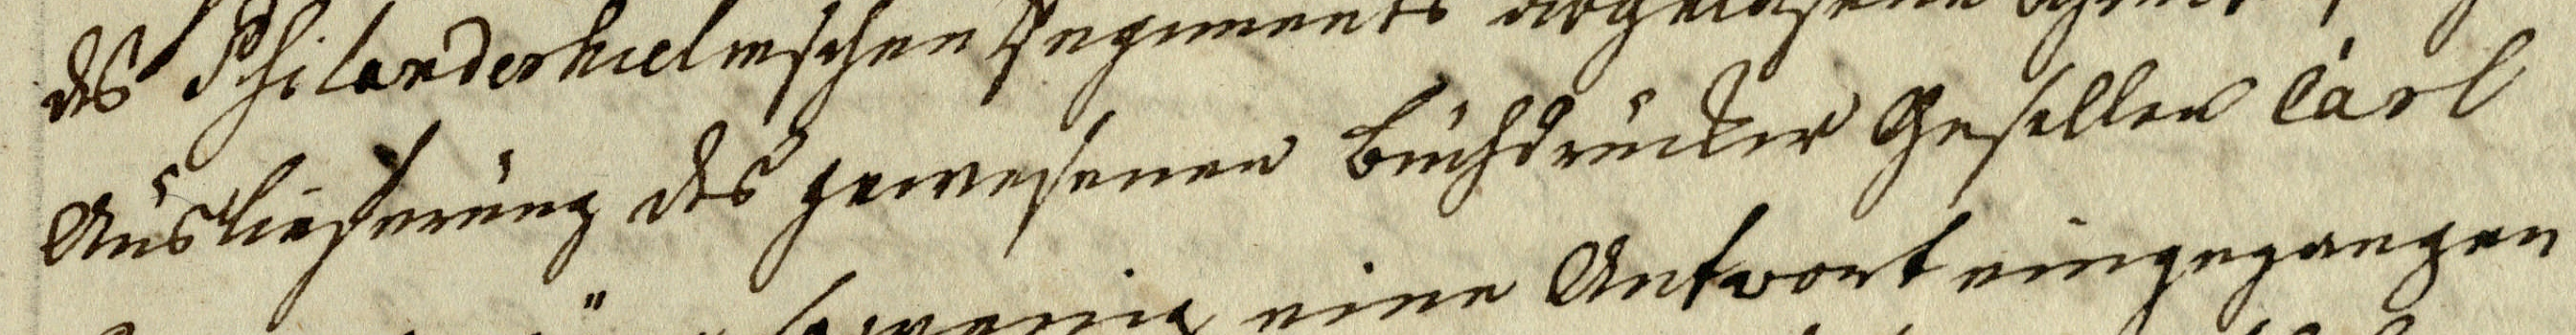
Auslieferung des gewesenen Buchdrucker Gesellen Carl
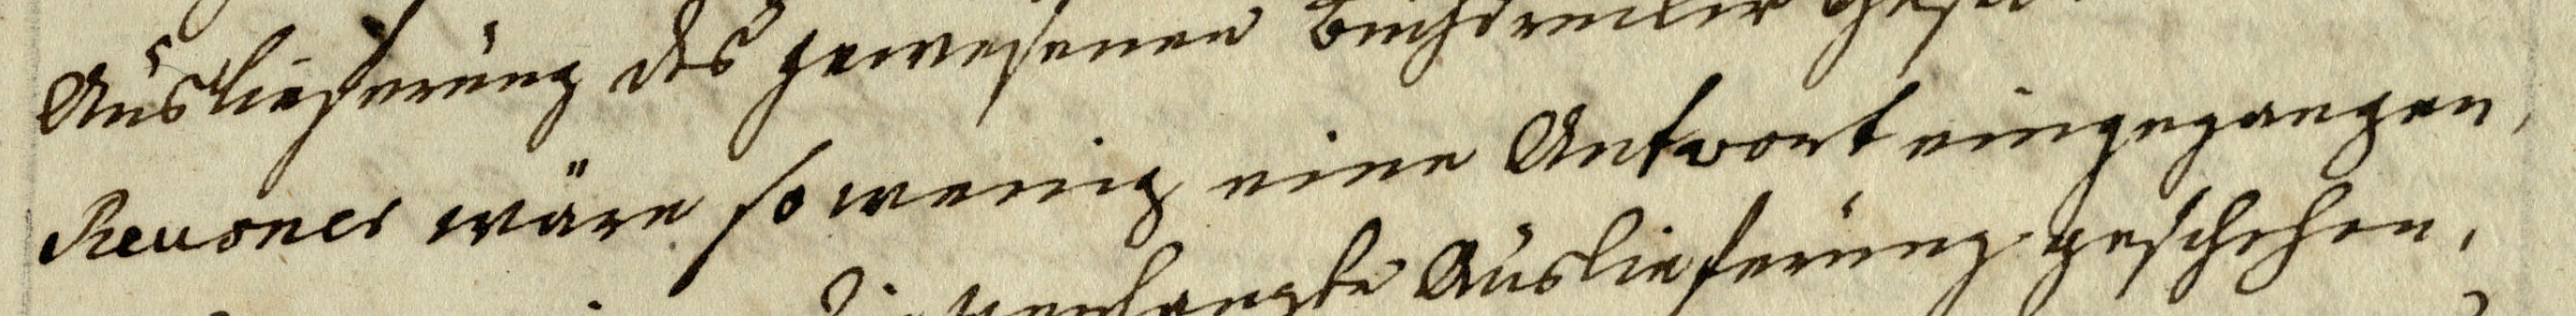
Reusner wäre so wenig eine Antwort eingegangen,
